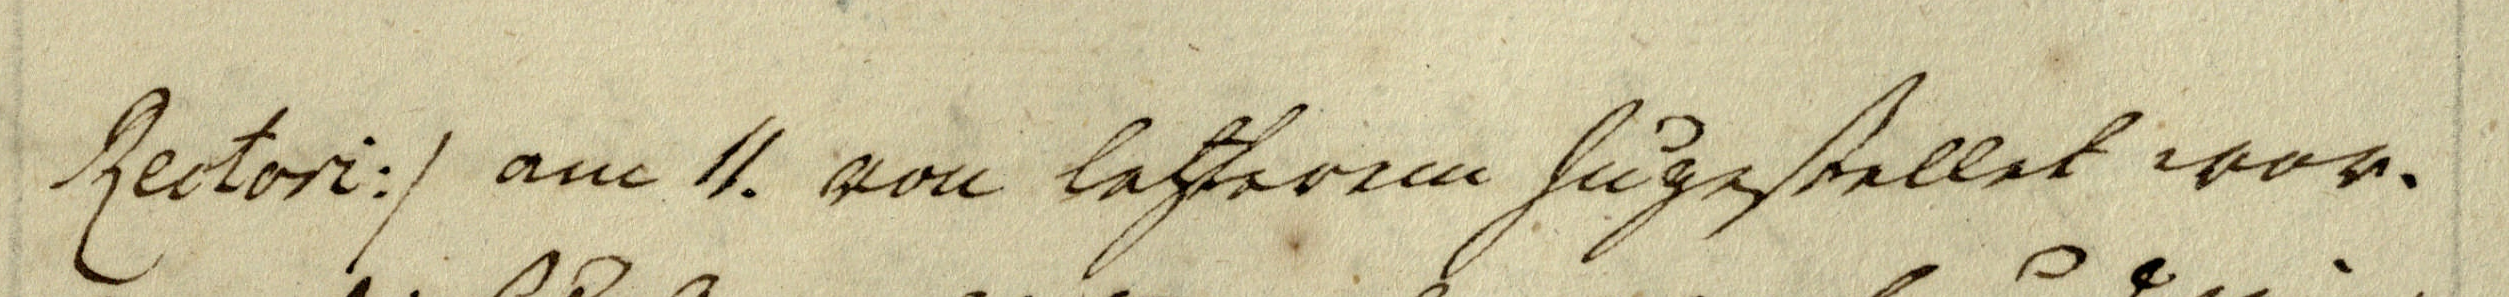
Rectori ./ am 11. von letzterem zugestellet wor¬
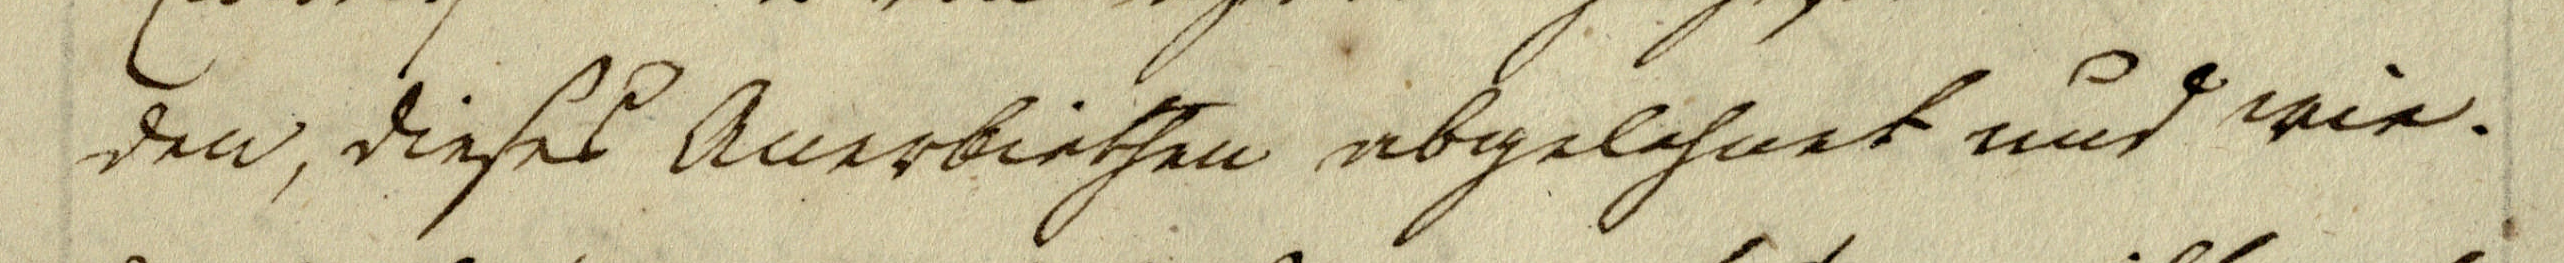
den, dieses Anerbiethen abgelehnet und wie¬
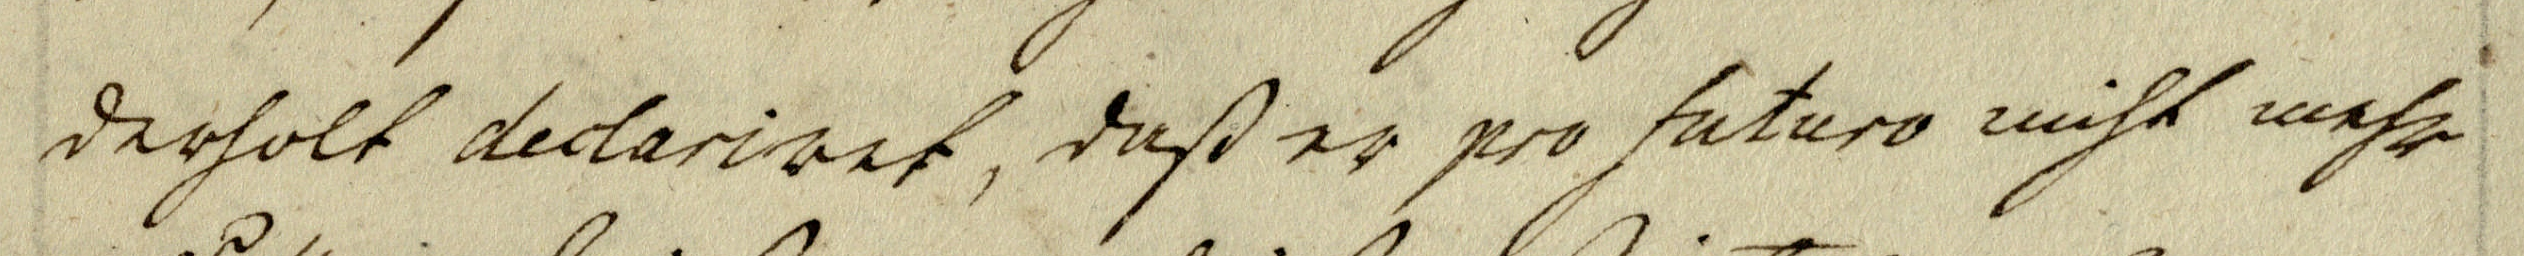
derholt declariret, daß er pro futuro nicht mehr
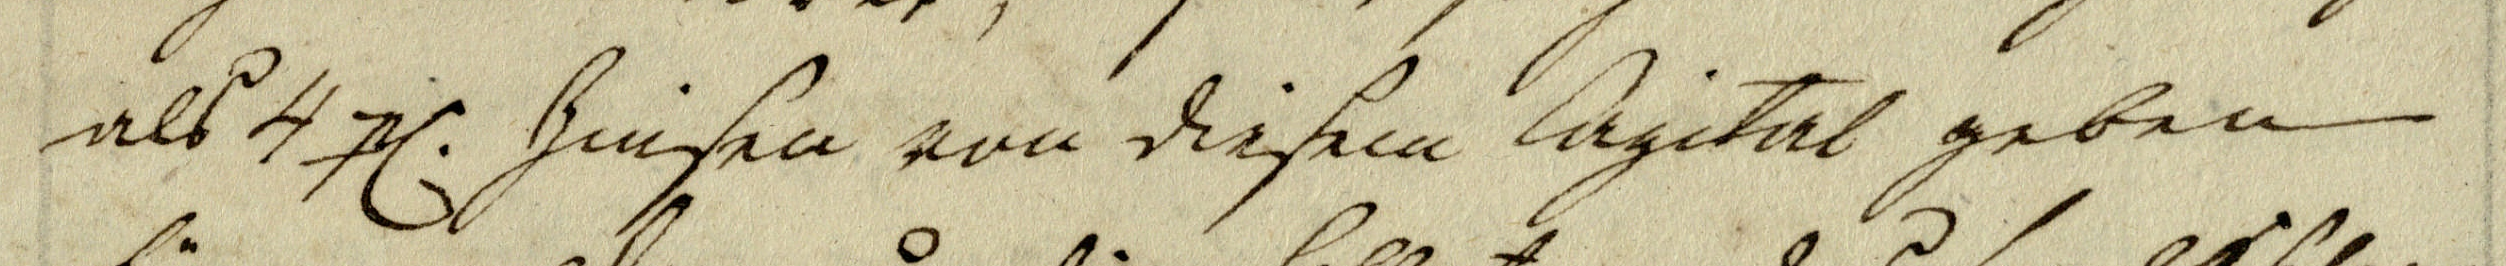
als 4 pl. Zinsen von diesem Capital geben
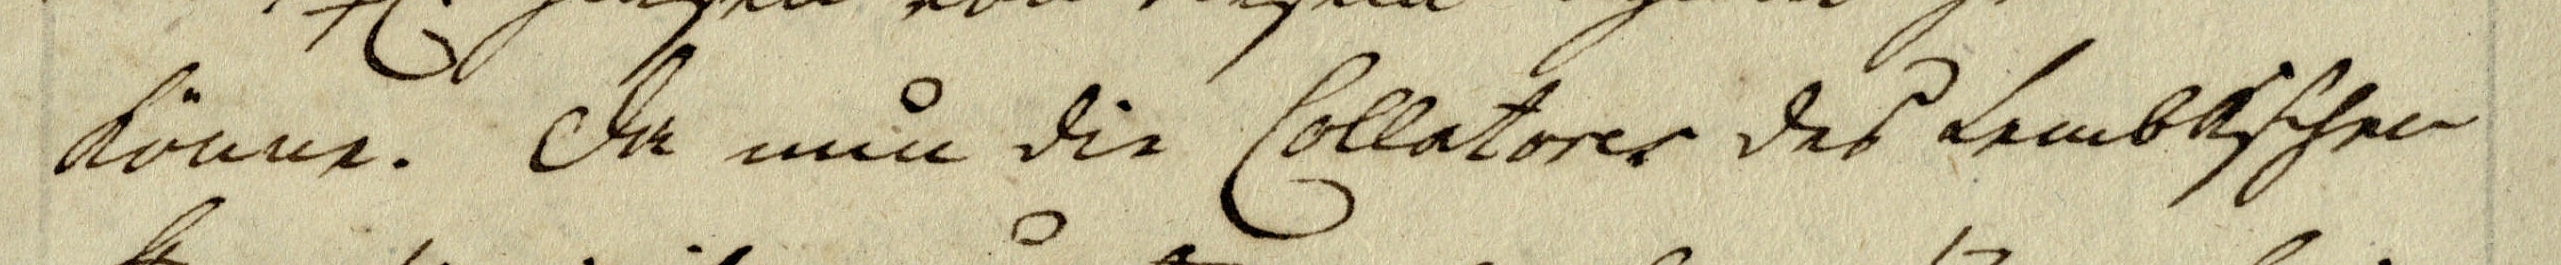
könne. Da nun die Collatores des Lembkschen
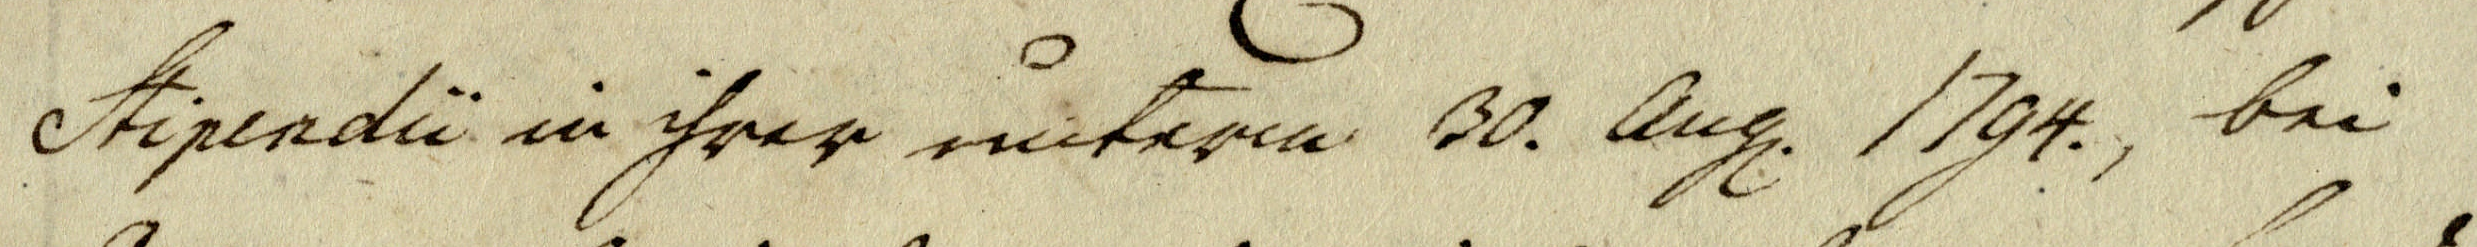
Stipendii in ihrer unterm 30. Aug. 1794., bei
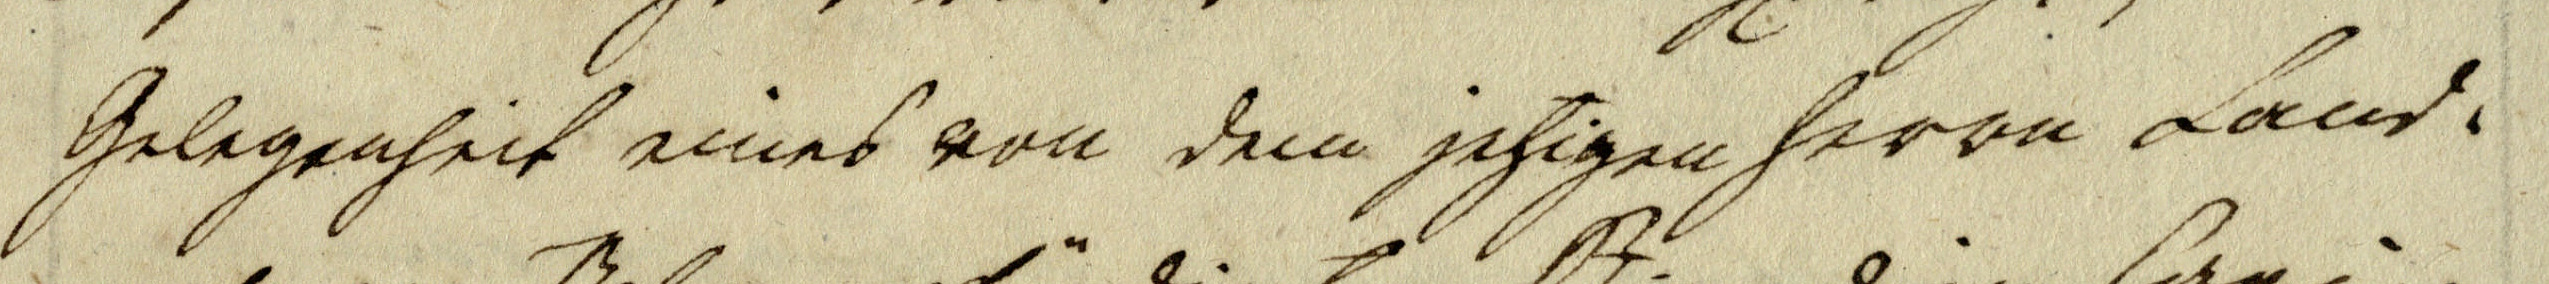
Gelegenheit eines von dem jetzigen Herrn Land¬
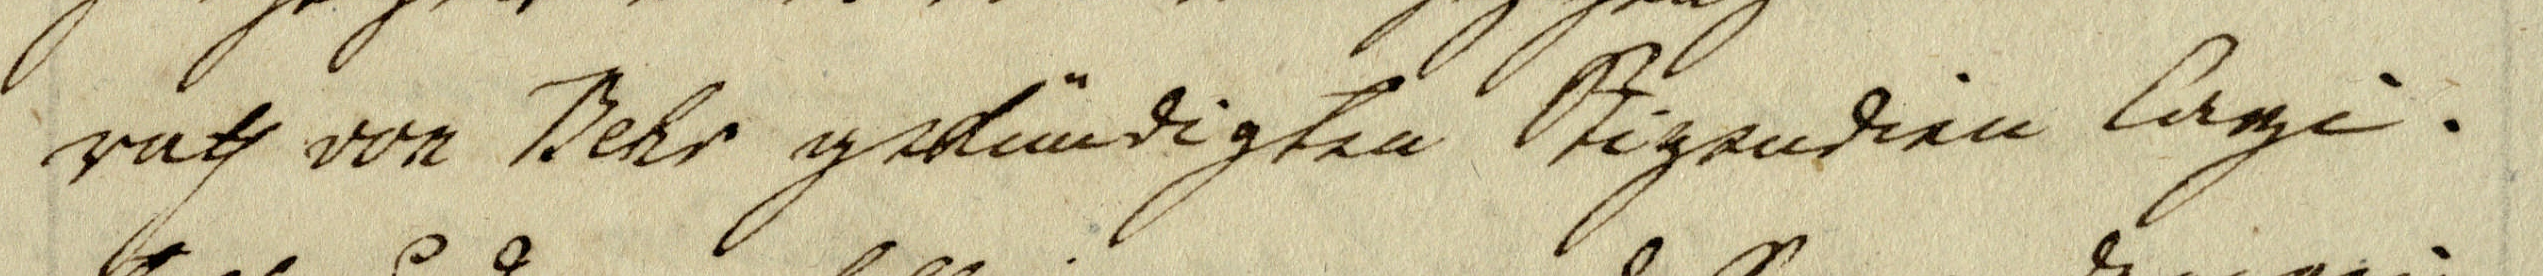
rath von Behr gekündigten Stipendien Capi¬
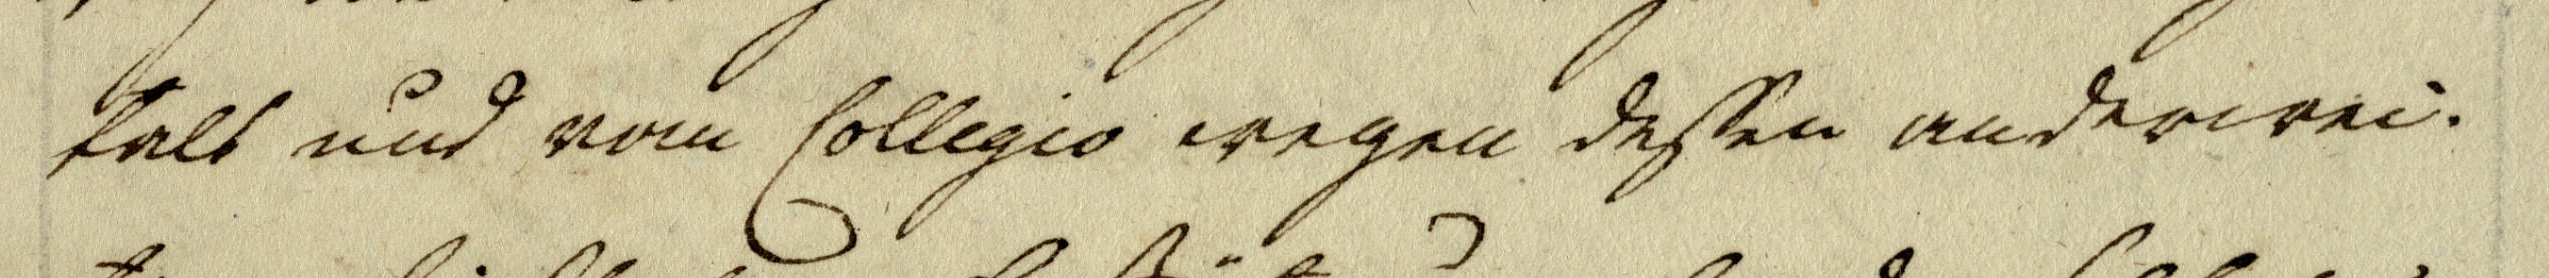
tals und vom Collegio wegen dessen anderwei¬
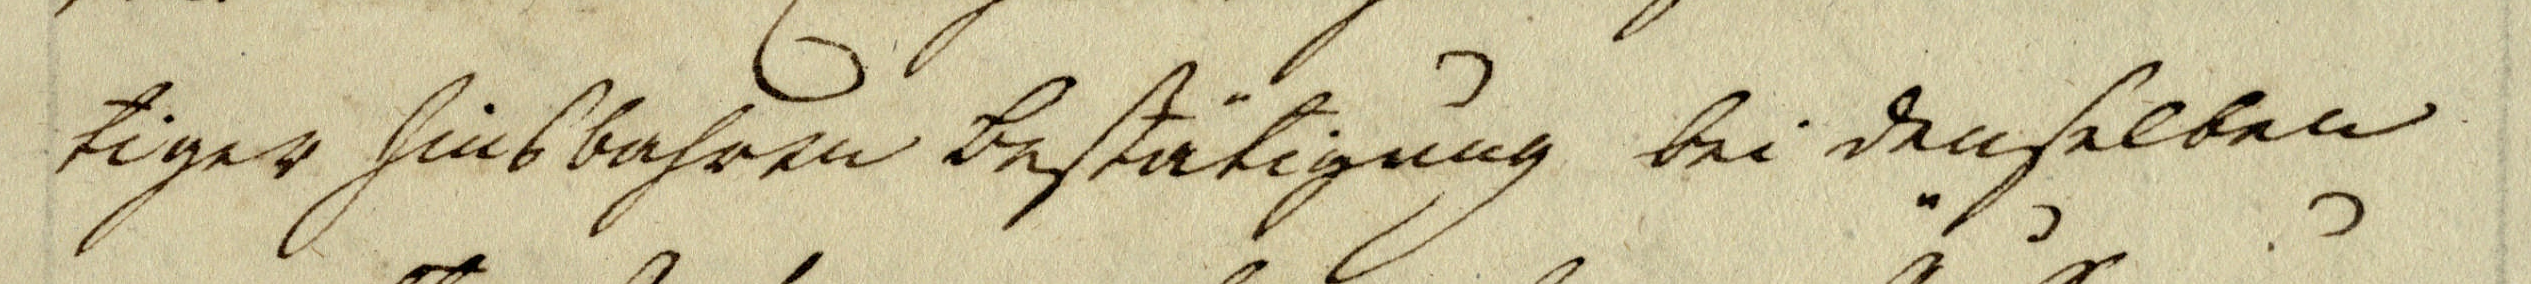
tiger zinsbahren Bestätigung bei denselben
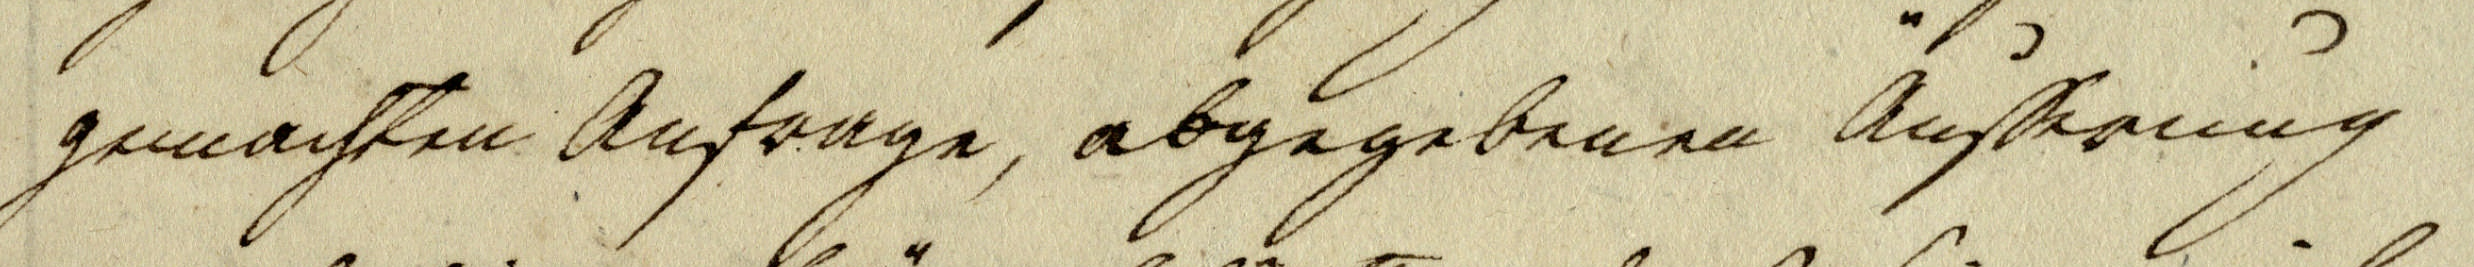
gemachten Anfrage, abgegebenen Äusserung
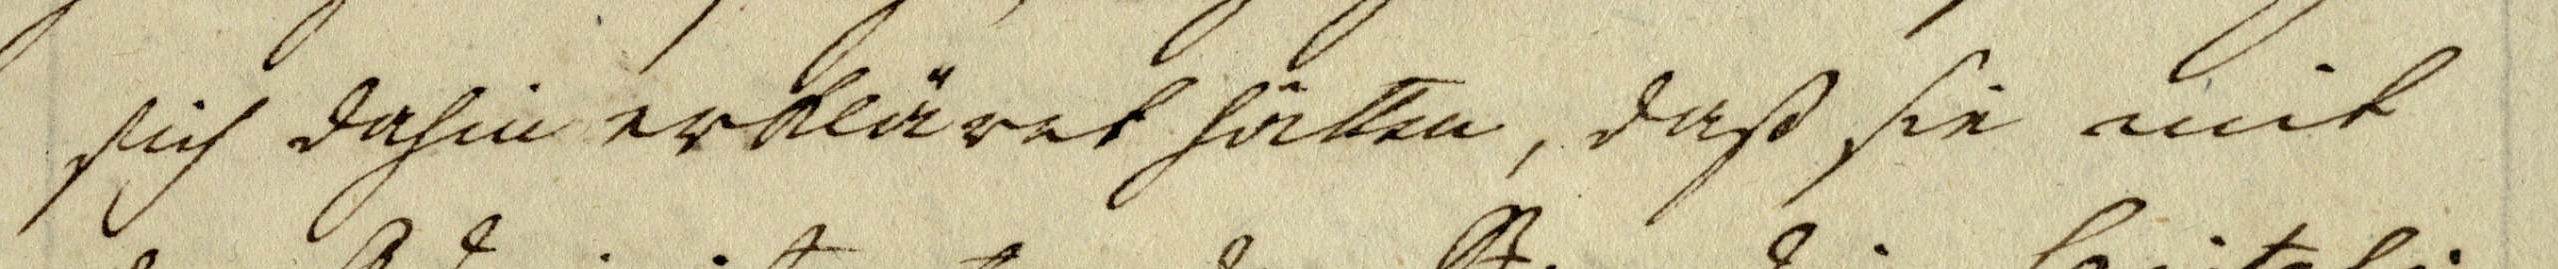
sich dahin erkläret hätten, daß sie mit
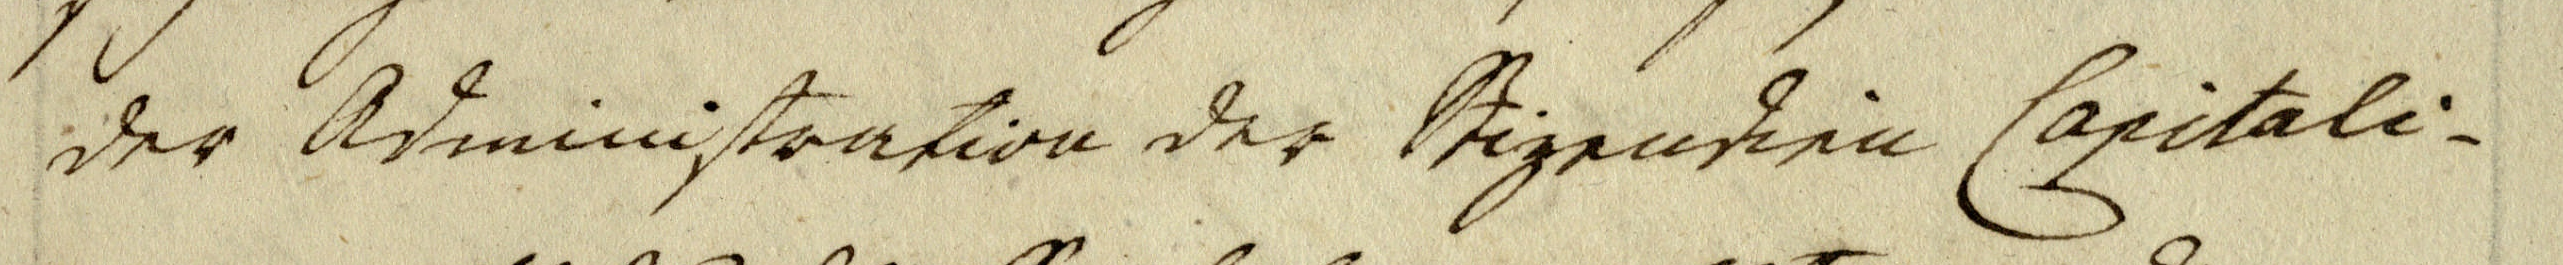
der Administration der Stipendien Capitali¬
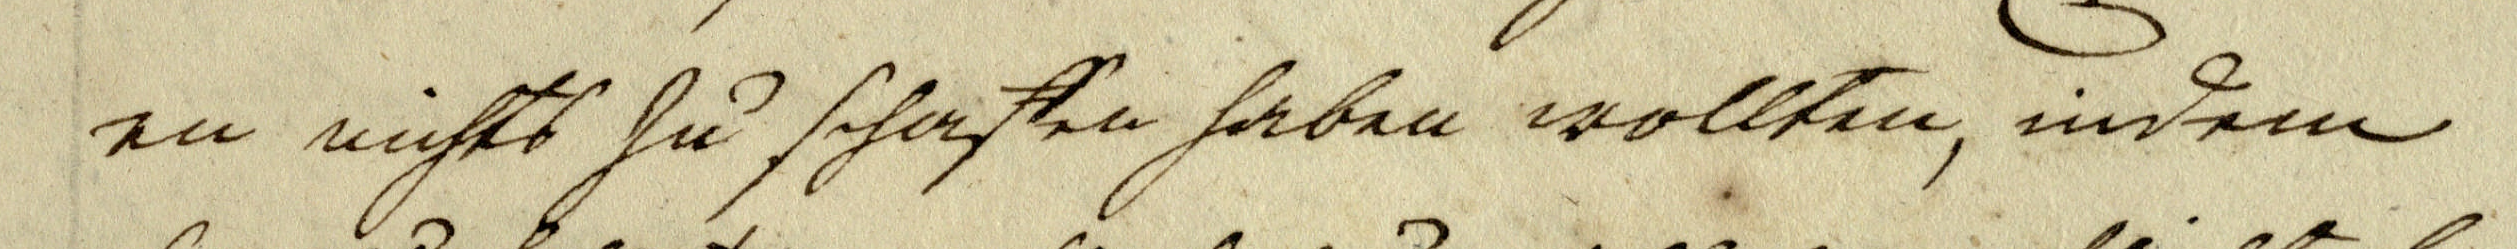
en nichts zu schaffen haben wollten, indem
